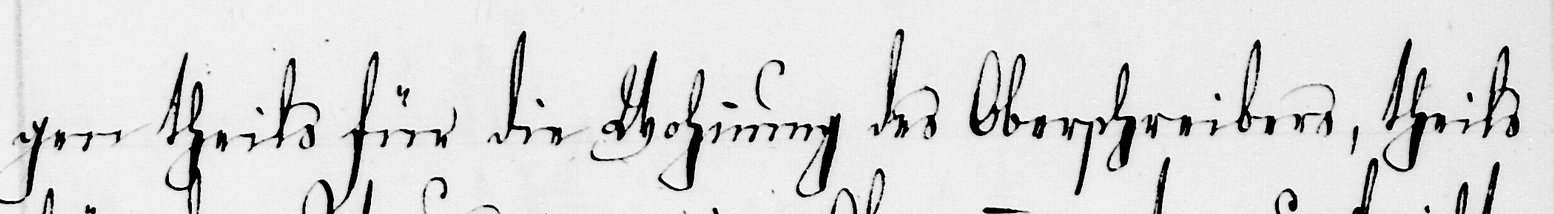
gen theils für die Wohnung des Oberschreibers, theils
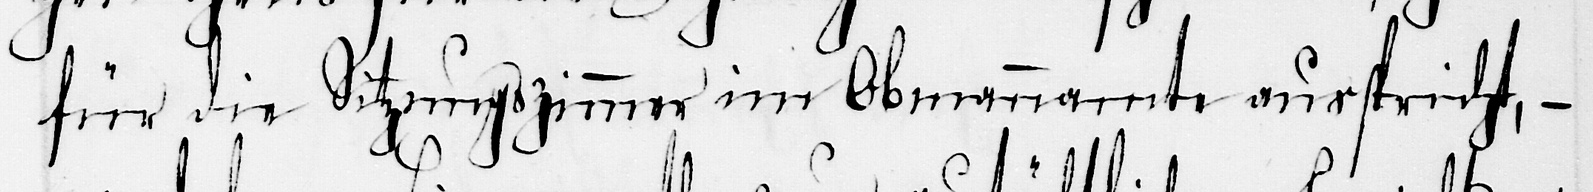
für die Sitzungszimmer im Obmannamte ausspricht, –
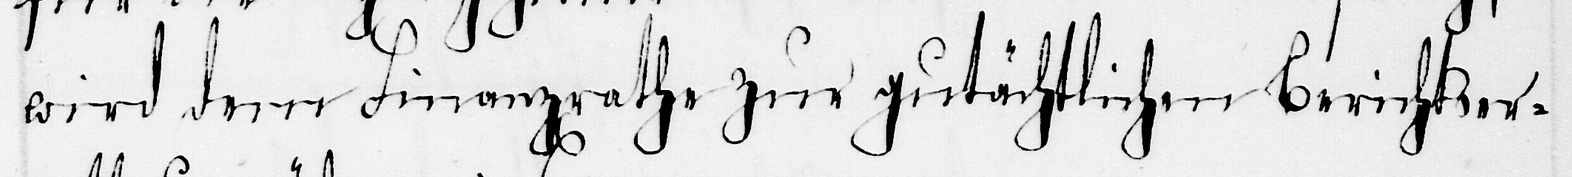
wird dem Finanzrathe zur gutächtlichen Berichtser¬
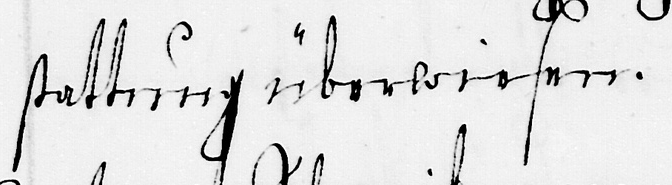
stattung überwiesen.
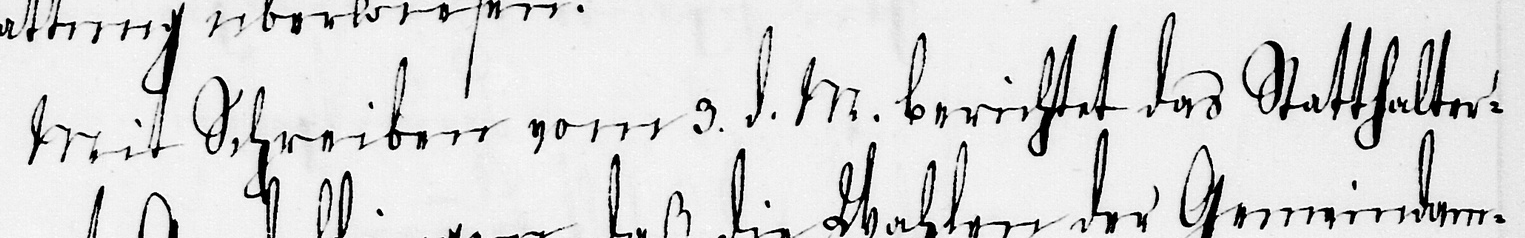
Mit Schreiben vom 3. d. M. berichtet das Statthalter¬
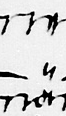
eindam¬
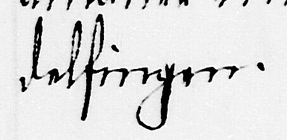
delfingen,
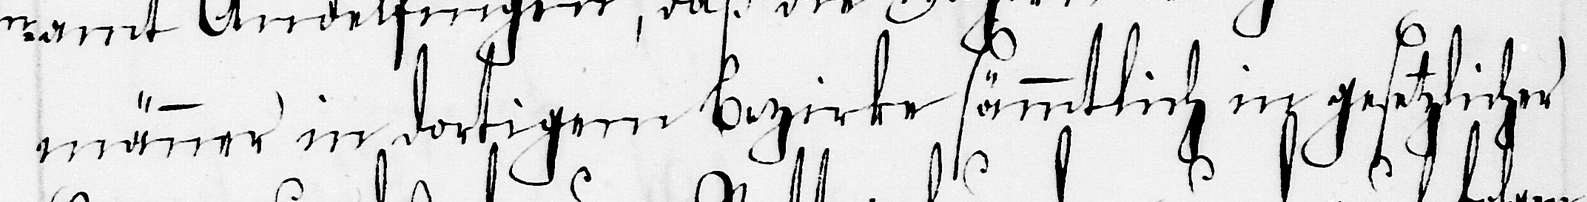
männer in dortigem Bezirke sämmtlich in gesetzlicher
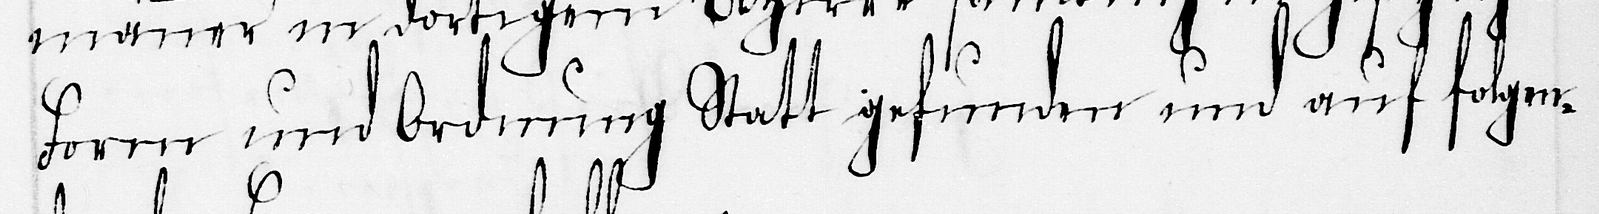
Form und Ordnung Statt gefunden und auf folgen¬
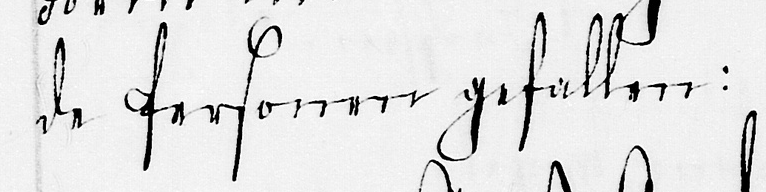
de Personen gefallen:
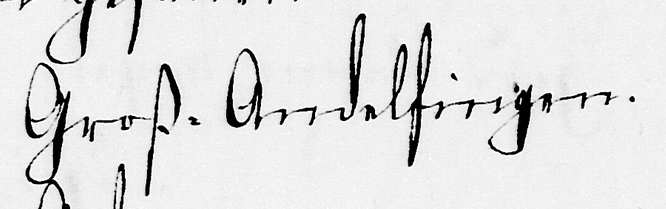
Groß-Andelfingen.
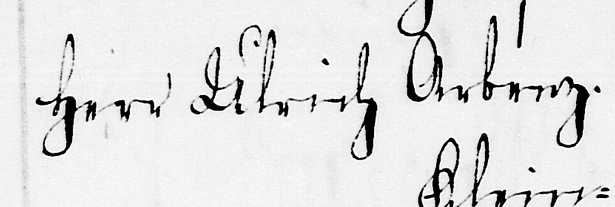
Herr Ulrich Arbenz.
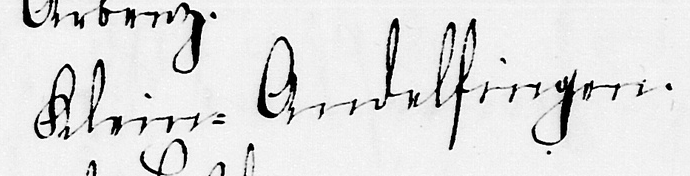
Klein-Andelfingen.
